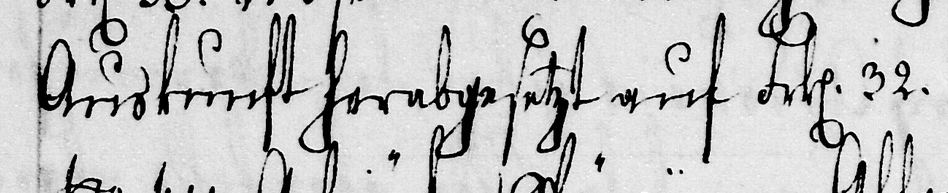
Auskunft herabgesetzt auf Frk[en].
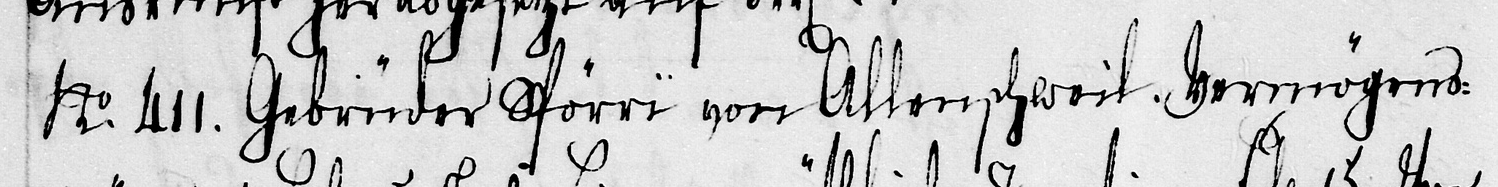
No. 411. Gebrüder Spörri von Allenschweil. Vermögens¬
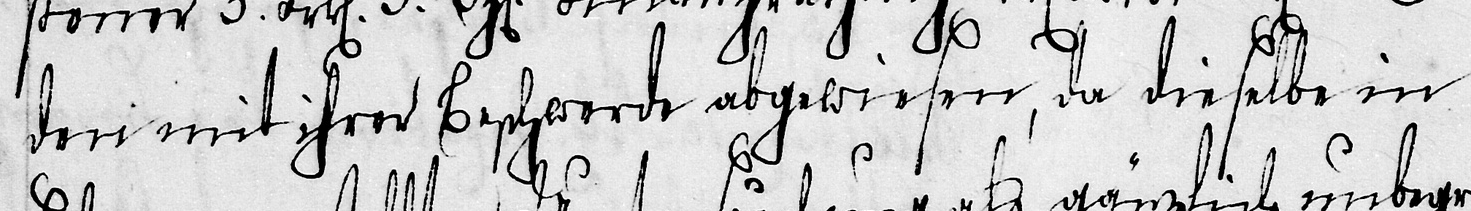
den mit ihrer Beschwerde abgewiesen, da dieselbe in
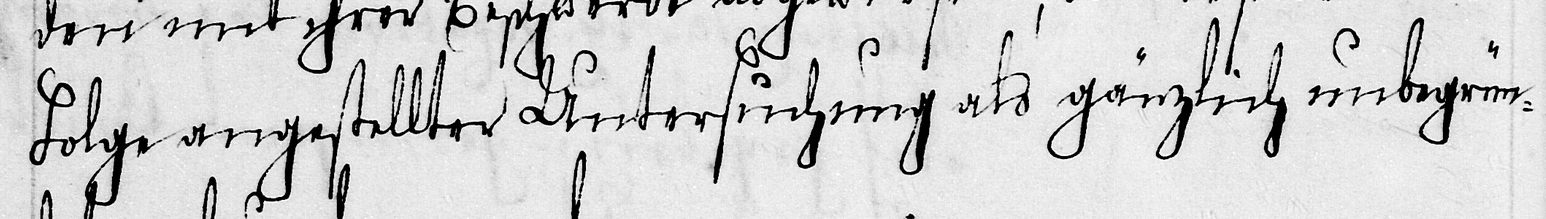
Folge angestellter Untersuchung als gänzlich unbegrün¬
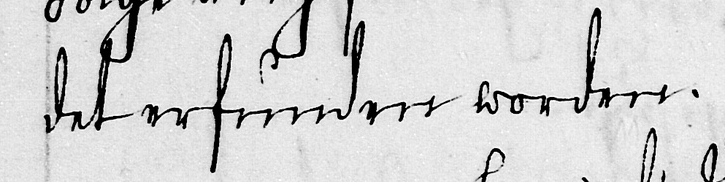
det erfunden worden.
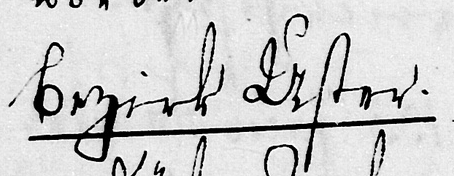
Bezirk Uster.
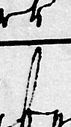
2.
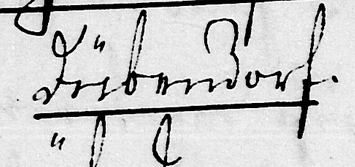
Dübendorf.
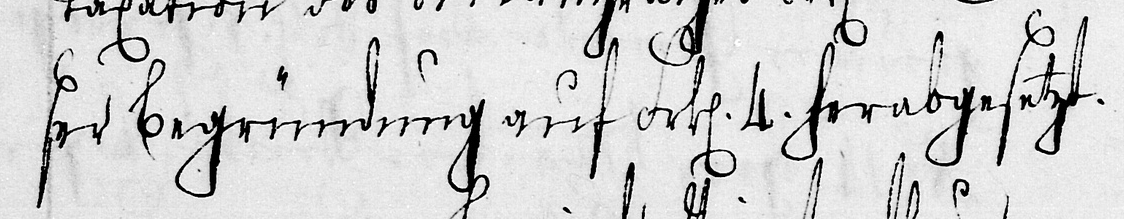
ser Begründung auf Frk[en]. 4. herabgesetzt.
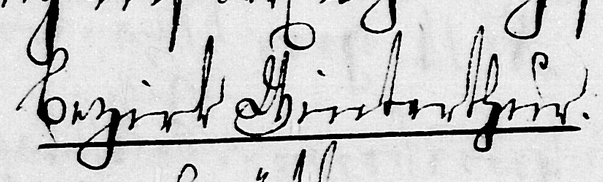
Bezirk Winterthur.
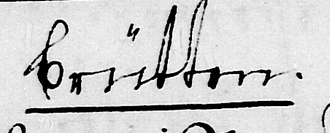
Brütten.
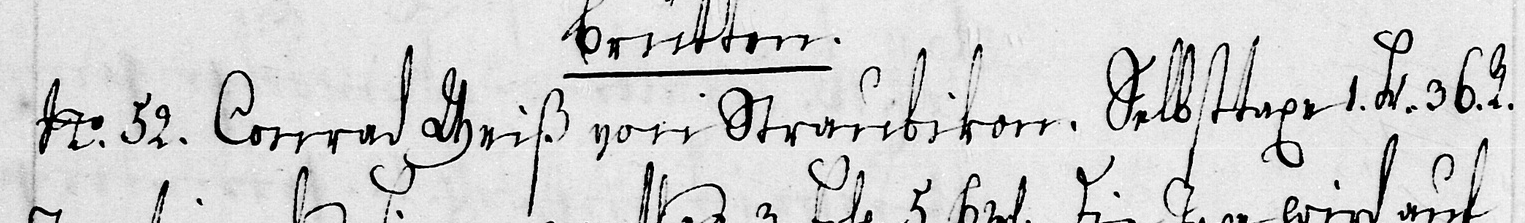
No. 52. Conrad Weiß von Straubikon. Selbsttaxe 1. Fr.
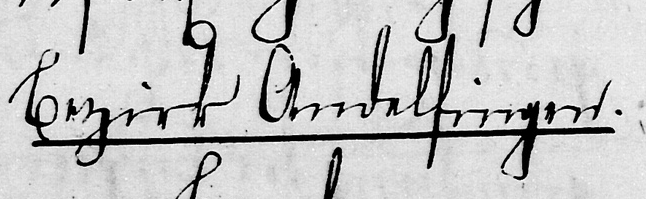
Bezirk Andelfingen.
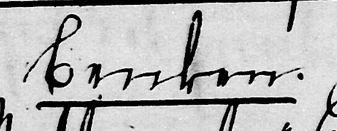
Benken.
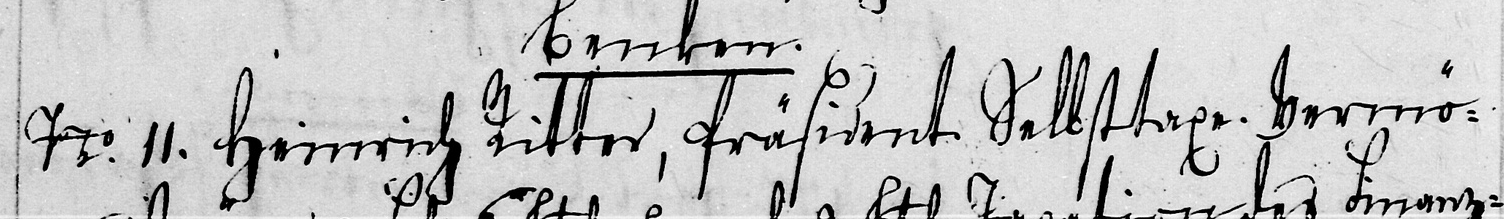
No. 11. Heinrich Ritter, Präsident. Selbsttaxe. Vermög¬
